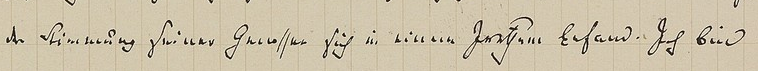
der Stimmung seiner Genossen sich in einen Irrthum befand. – Ich bin
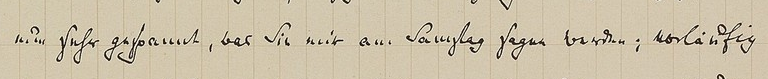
nun sehr gespannt, was Sie mir am Samstag sagen werden; vorläufig
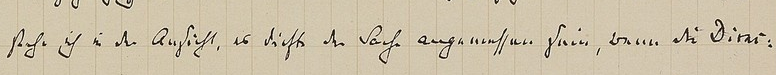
stehe ich in der Ansicht, es dürfte der Sache angemessen sein, wenn die Direc-
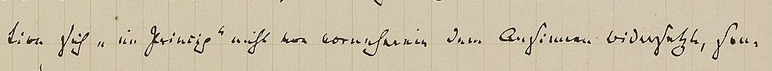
tion sich «im Princip» nicht von vorneherein dem Ansinnen widersetzte, son-
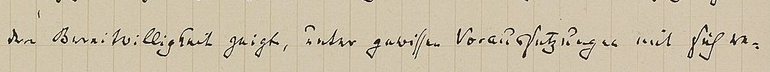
dern Bereitwilligkeit zeigte, unter gewissen Voraussetzungen mit sich re-
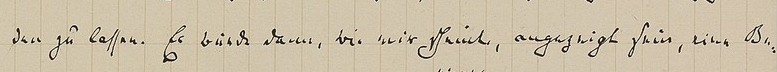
den zu lassen. Es würde dann, wie mir scheint, angezeigt sein, eine Be-
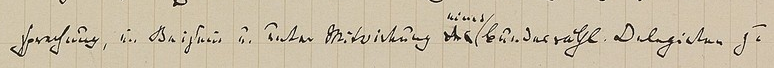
sprechung, im Beisein u. unter Mitwirkung eines bundesräthl. Delegirten zu
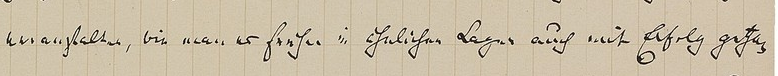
veranstalten, wie man es früher in ähnlichen Lagen auch mit Erfolg gethan
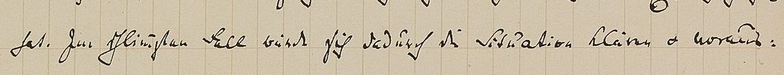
hat. Im schlimmsten Fall würde sich dadurch die Situation klären & voraus-
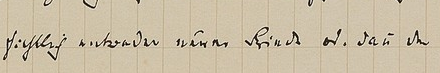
sichtlich entweder neuer Friede od. dann der
